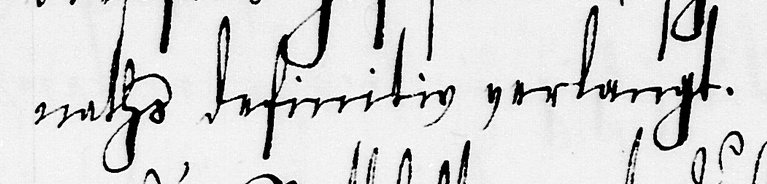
naths definitiv verlangt.
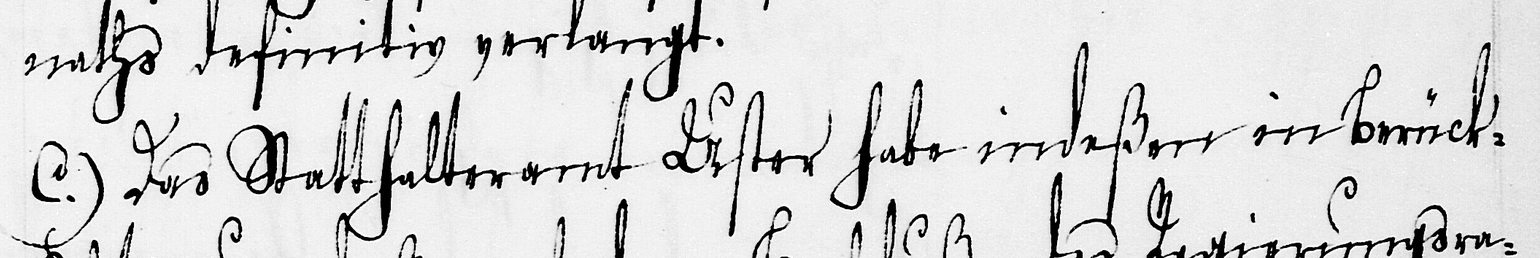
C.) Das Statthalteramt Uster habe indeßen in Berück¬
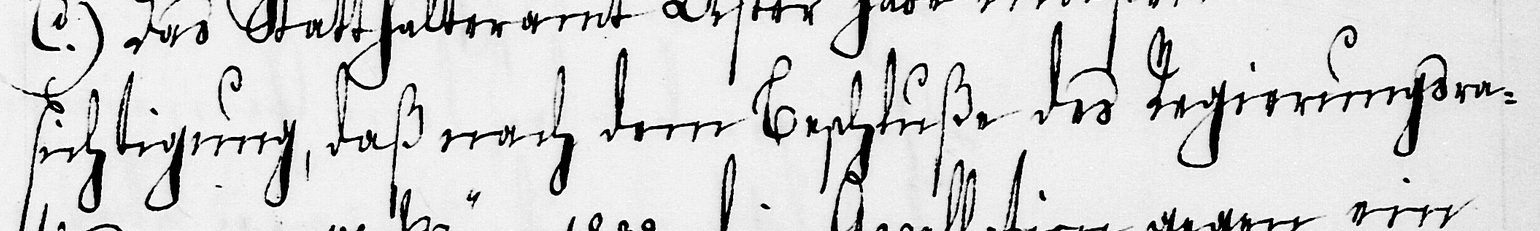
sichtigung, daß nach dem Beschluße des Regierungsra¬
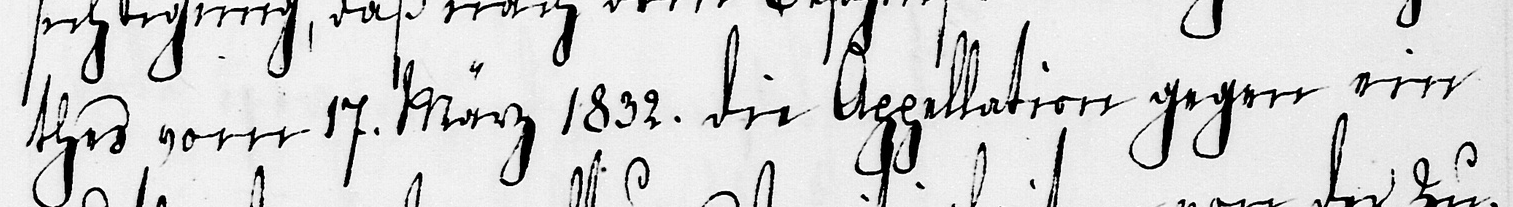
thes vom 17. März 1832. die Appellation gegen ein
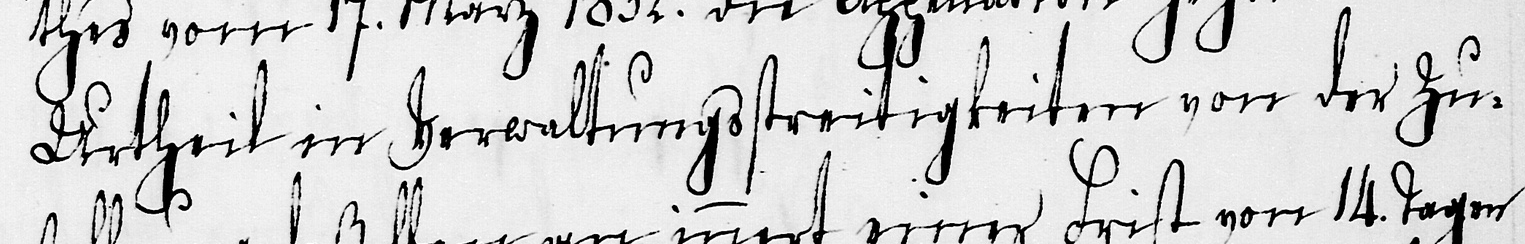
Urtheil in Verwaltungsstreitigkeiten von der Zu¬
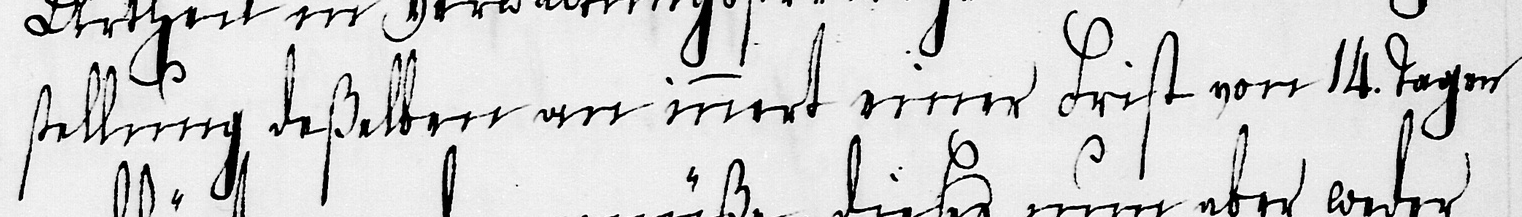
stellung deßelben an innert einer Frist von 14. Tagen
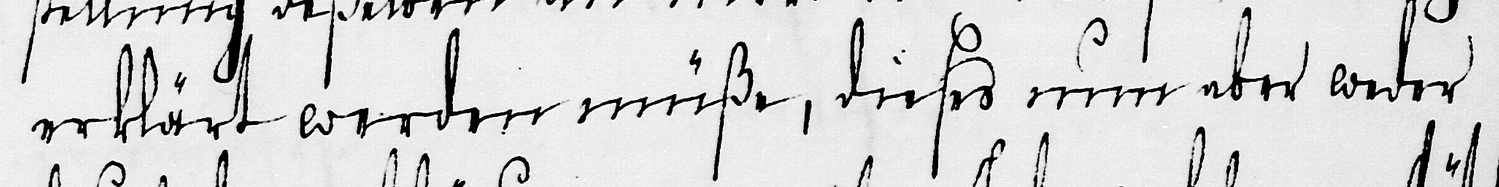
erklärt werden müße, dieses nun aber weder
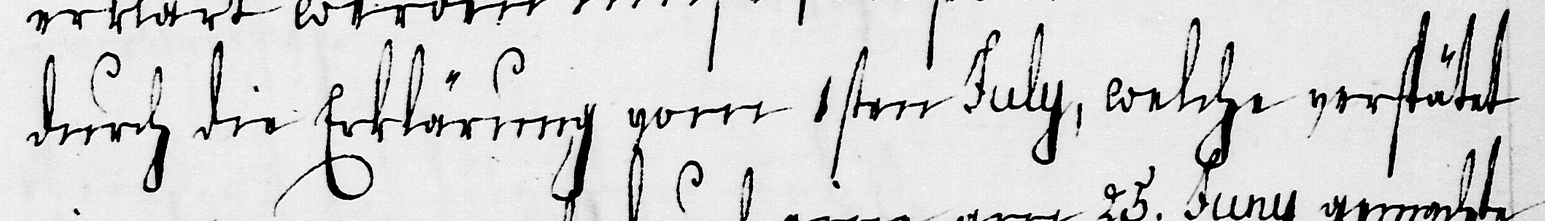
durch die Erklärung vom 1sten July, welche verspätet
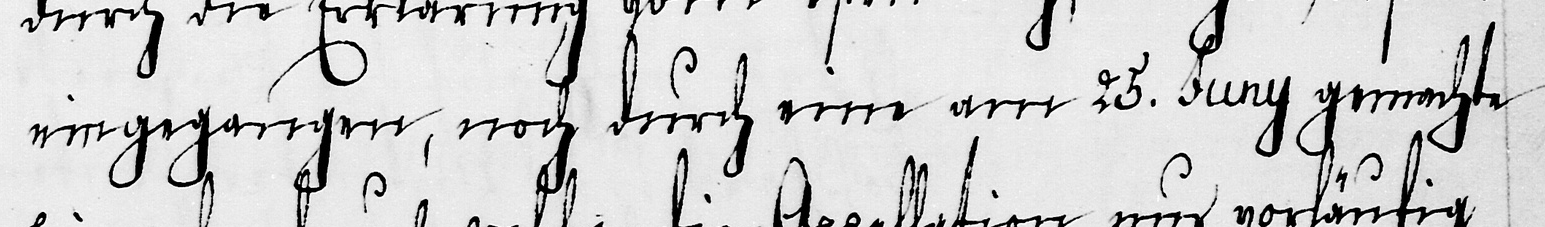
eingegangen, noch durch eine am 25. Juny gemachte
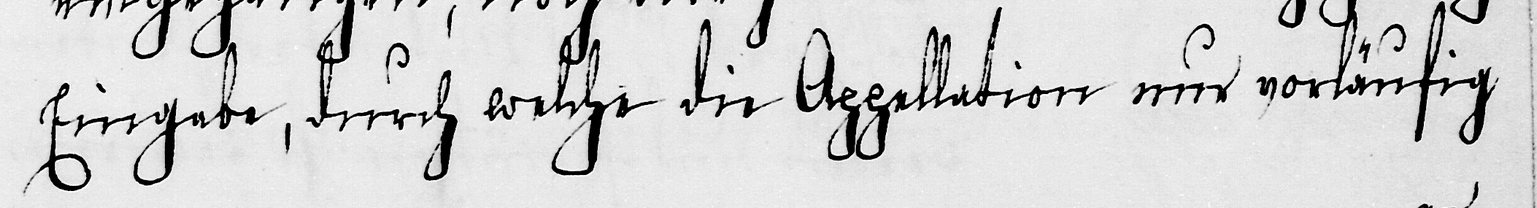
Eingabe, durch welche die Appellation nur vorläufig
